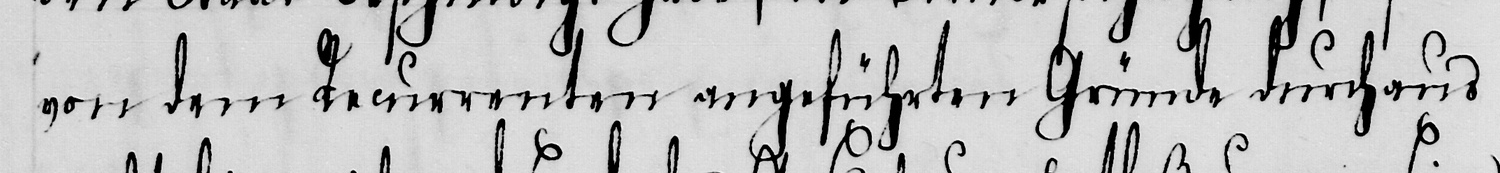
von dem Recurrenten angeführten Gründe durchaus
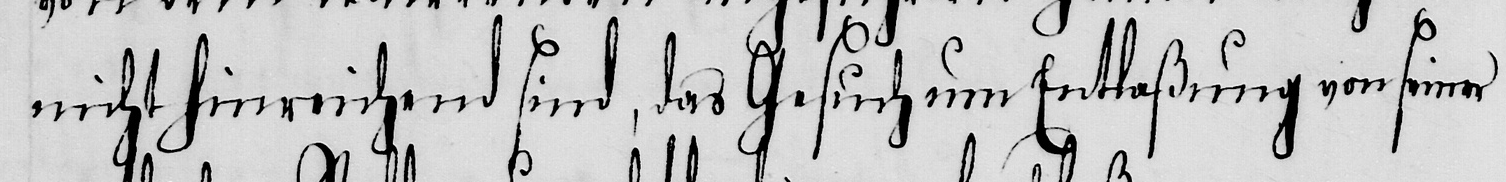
nicht hinreichend sind, das Gesuch um Entlaßung von sein¬
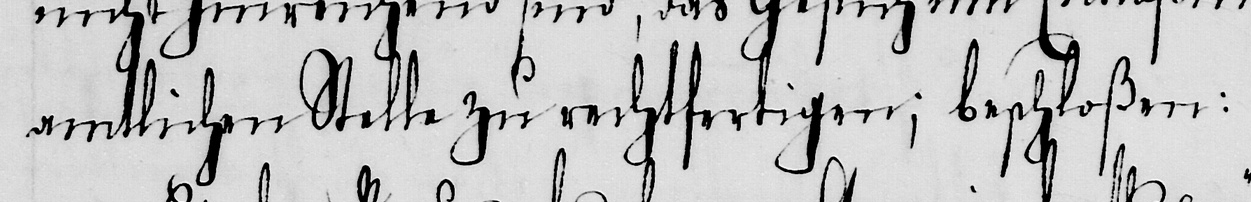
amtlichen Stelle zu rechtfertigen; beschloßen:
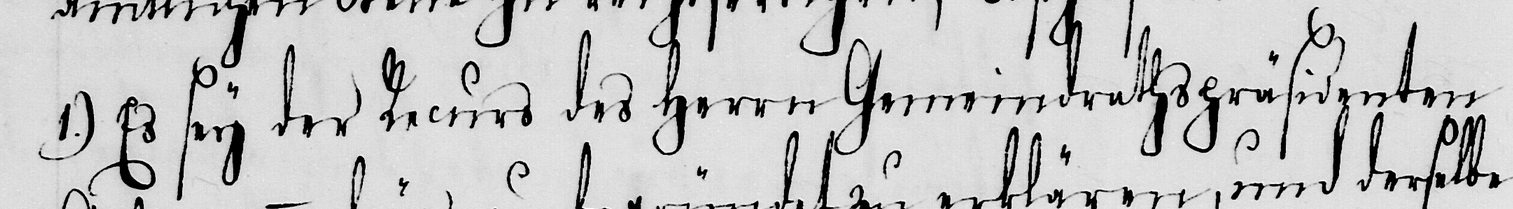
1.) Es sey der Recurs des Herrn Gemeindrathspräsidenten
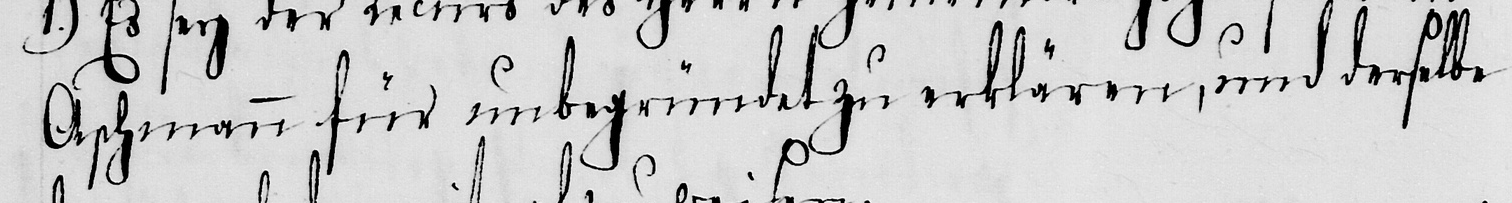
Aschmann für unbegründet zu erklären, und derselbe
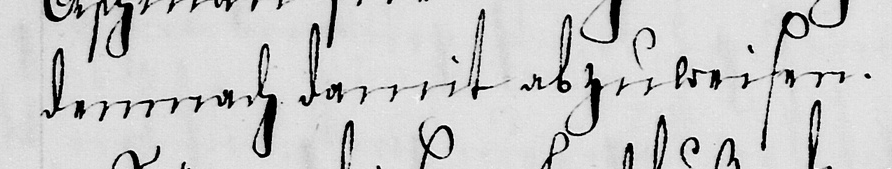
demnach damit abzuweisen.
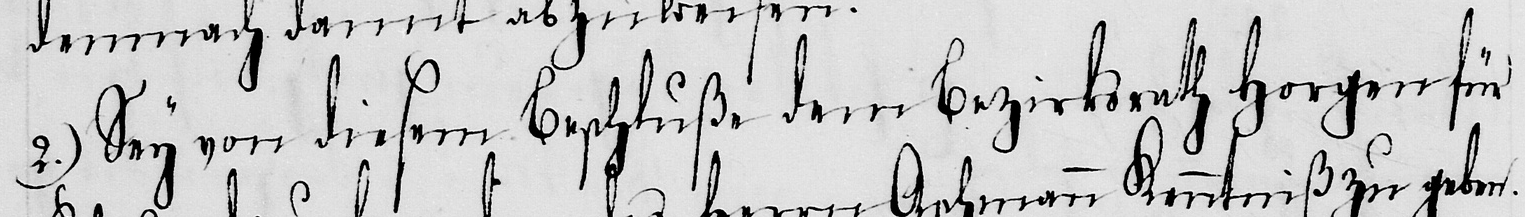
2.) Sey von diesem Beschluße dem Bezirksrath Horgen für
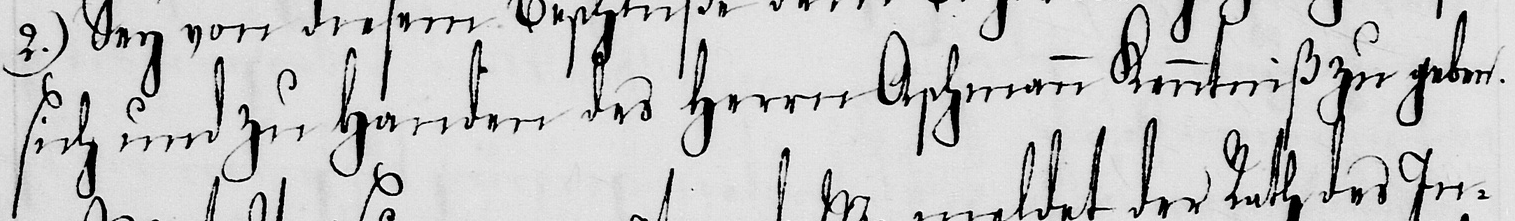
sich und zu Handen des Herrn Aschmann Kenntniß zu gebe¬
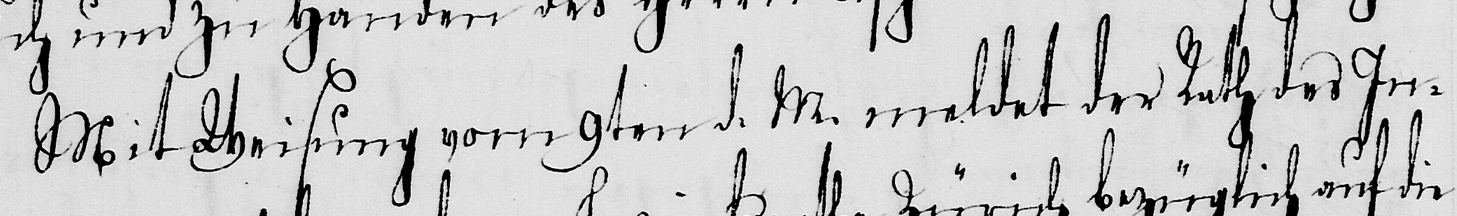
Mit Weisung vom 9ten d. M. meldet der Rath des In¬
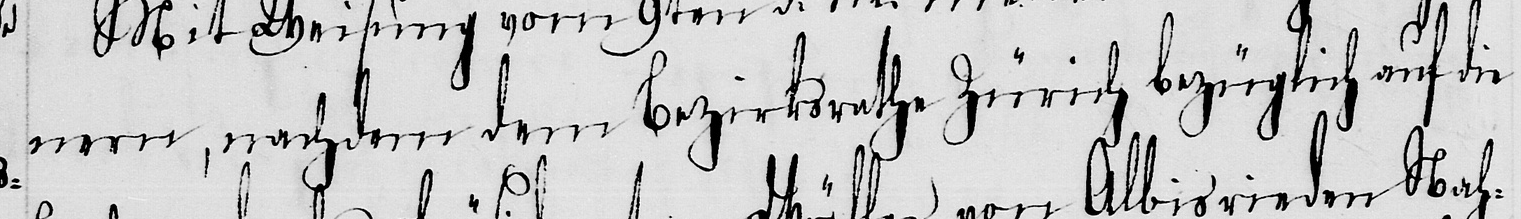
nern, nachdem dem Bezirksrathe Zürich bezüglich auf die
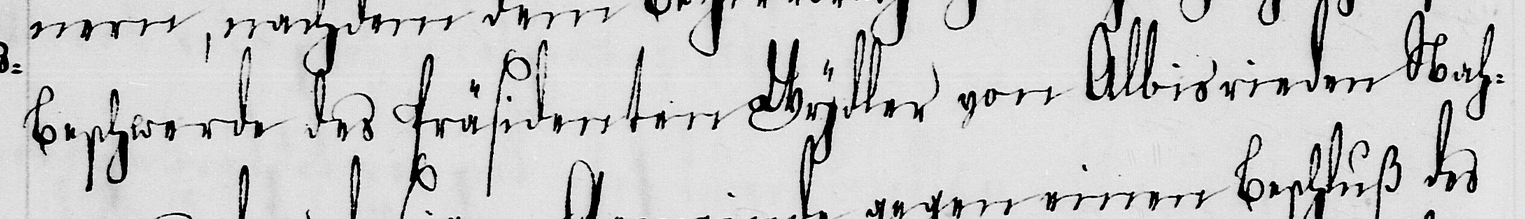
Beschwerde des Präsidenten Wydler von Albisrieden Nah¬
